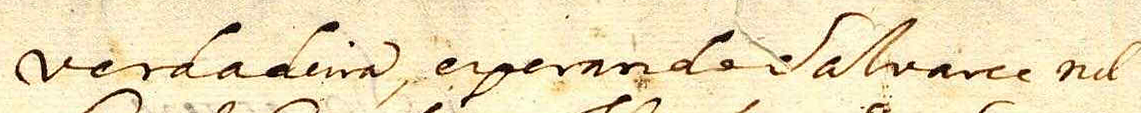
verdadeira, esperando salvarce nel
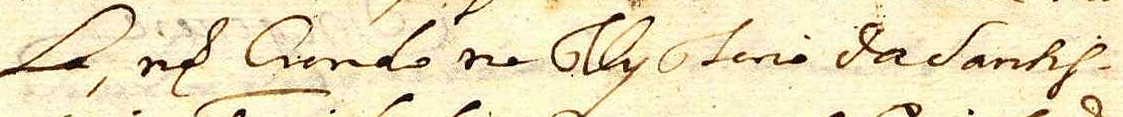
La, naõ Crendo no Mysterio da Santis
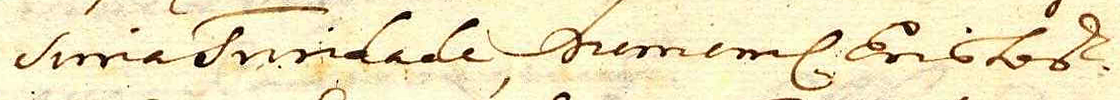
sima Trindade, nem em Cristo sor.
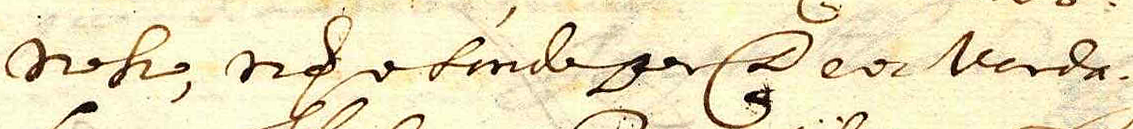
nosso, naõ o tendo por Deos Verda
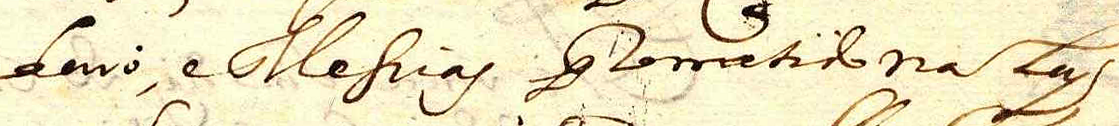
deiro, e Messias prometido na Ley
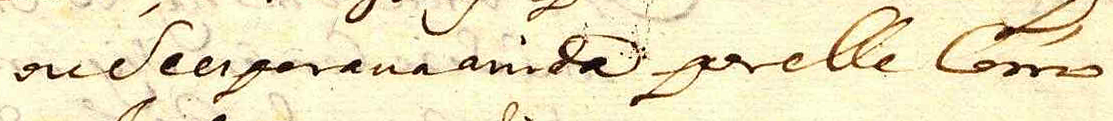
ou se esperaua ainda por elle Como
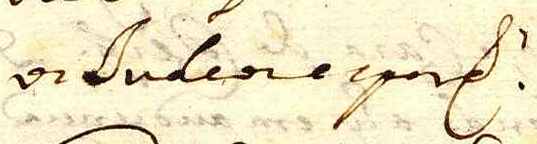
os Iudeos esperaõ?
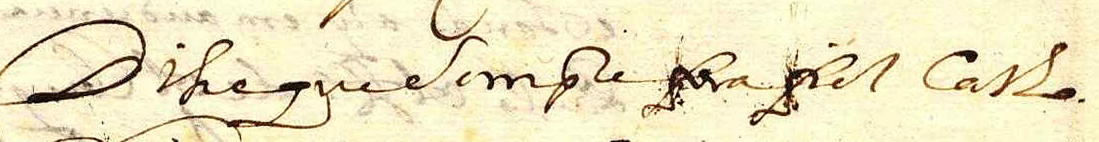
Disse que sempre fora fiel Catho.
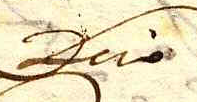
Lico
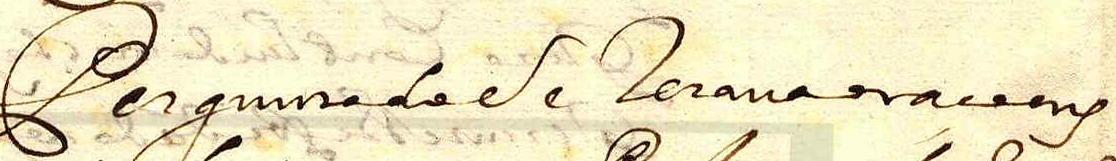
Perguntado Se Rezaua oraçoens
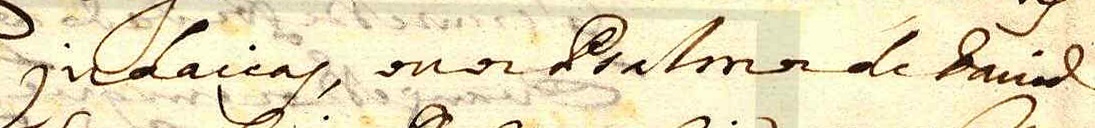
judaicas, ou os Psalmos de Dauid
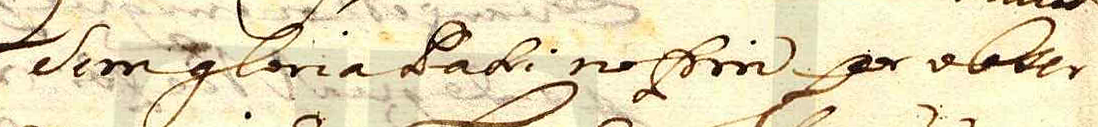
Sem gloria Patri no fim por obser
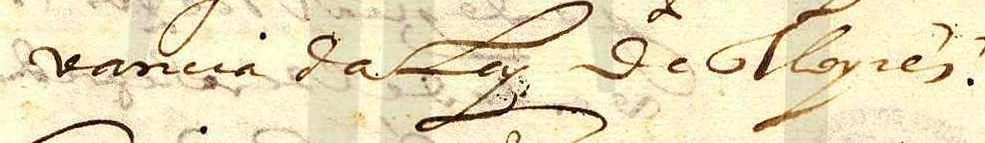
vancia da Ley de Moyzés?
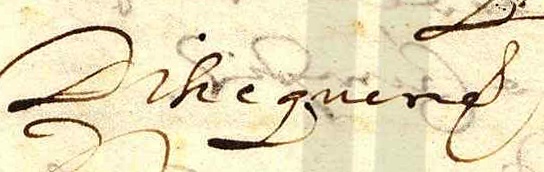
Disse que naõ
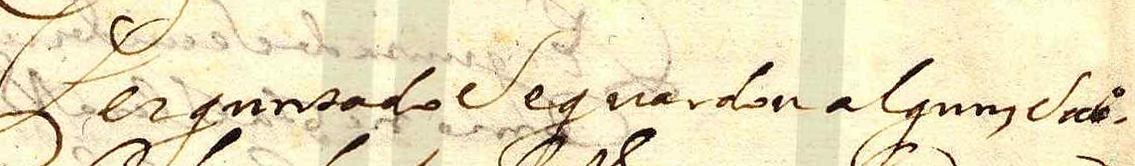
Perguntado se guardou alguns Sab
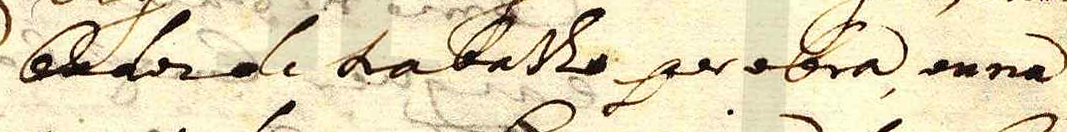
bados de trabalho por obra, ou na
